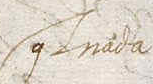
q̄ nada
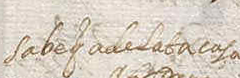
sabe q̄ a delata casa
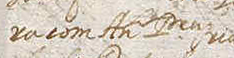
ra com Anto Pra Cria
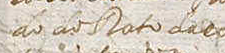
do do Rato da co
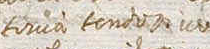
touia tendo uiuo
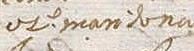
o 1.o mando na
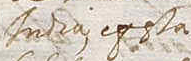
Jndia, e q̄ sta
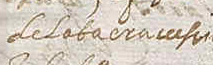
deLata era uesin
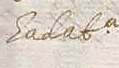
ha da t.a
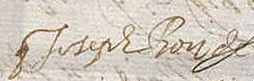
q̄ Joseph Roiz de
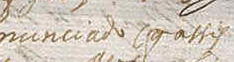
nunciado o q̄ assis
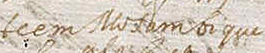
te em Mosambique
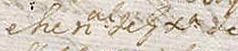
e he nal. de Lx.a de
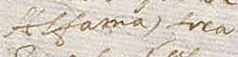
Alfama, fora
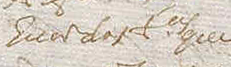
huā das t.as que
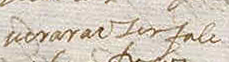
iurara ser fale
